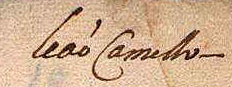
leaõ Camello
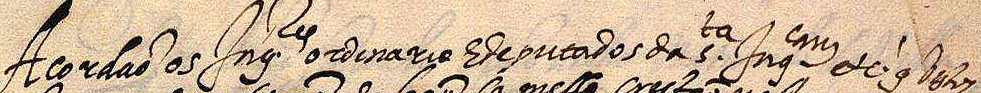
Acordaõ os Jnq.res ordinario E deputados da sta. Jnqcam de q̄ Vistos
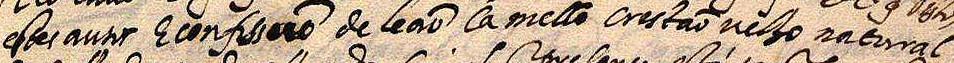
estes autos E confissaõ de leaõ camello cristaõ uelho natural
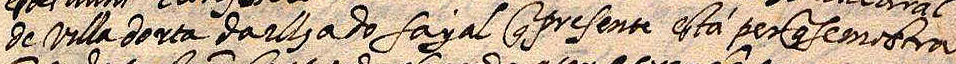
de villa dorta da ilha do Fayal q̄ presente está per q̄ se mostra
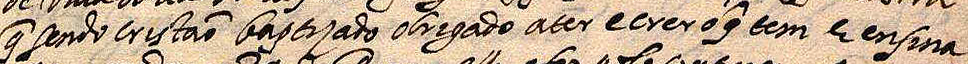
q̄ sendo cristaõ baptizado obrigado a ter e crer o q̄ tem, E ensina
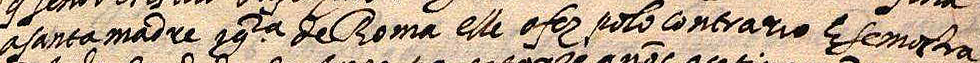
a santa madre ig.ra de Roma elle o fez pelo contrario E se mostra
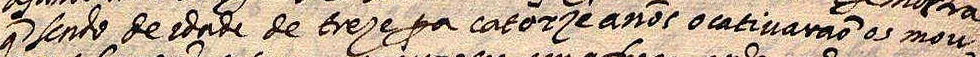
q̄ sendo de idade de treze ꝑa catorze anōs o catiuaraõ os mou
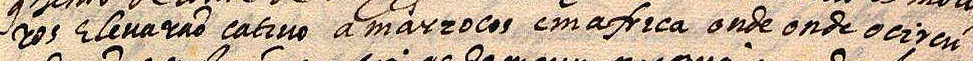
ros E leuarão catiuo a marrocos em africa onde onde o circū
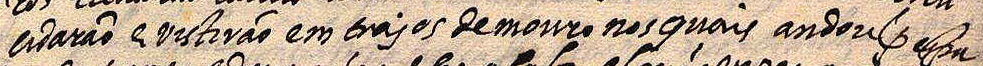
cidaraõ e vestirão em trajos de mouro nos quais andou p̄ espa
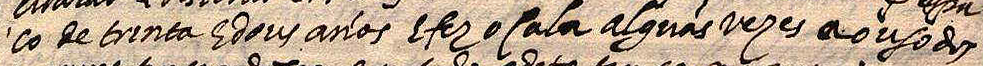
ço de trinta E dous an̄os E fez o Cala alguās vezes ao uso dos
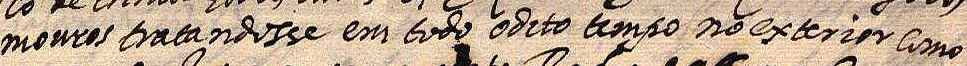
mouros tratandosse em todo o dito tempo no exterior como
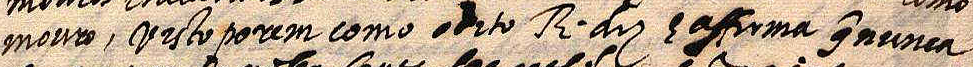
mouro, visto porem como o dito R. diz E affirma q̄ nunca
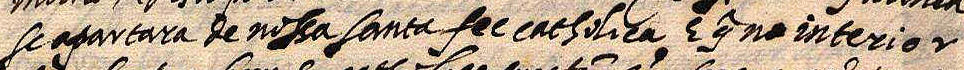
se apartara de nossa santa fee catholica E q̄ no interior
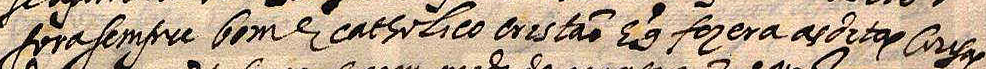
fora sempre bom e catholico cristaõ E q̄ fizera as ditas cousas
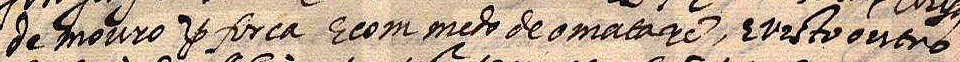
de mouro p̄ força E com medo de o matarē, E visto outro
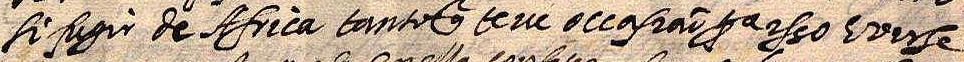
si fugir de Africa tanto q̄ teue occasiaõ ꝑa isso e virse
